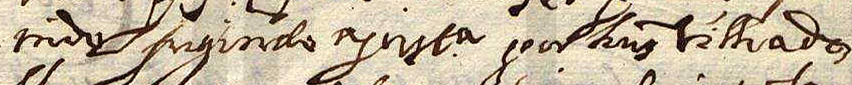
indo fugindo a just.a por hūs tilhados
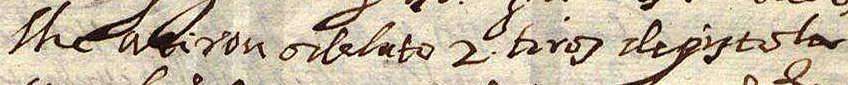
lhe a tirou o delato 2 tiros de pistola
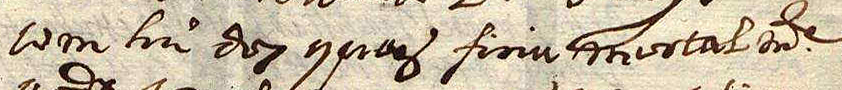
com hū dos quaes firiu mortalm.te
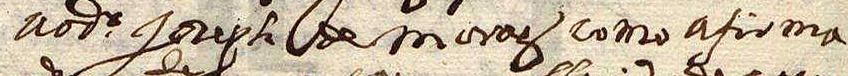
ao d.o Jozeph de moraes como afirma
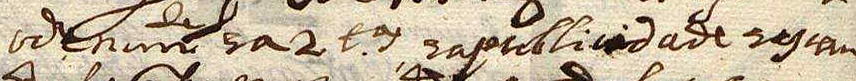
o denunte E a 2 t.as, E a publicidade E escan
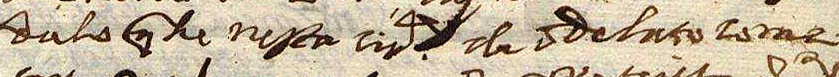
dalo q̄ he nesta cid.e de o delato come
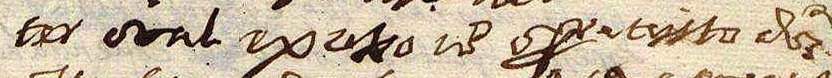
ter o tal excesso cō o preteisto do s.to
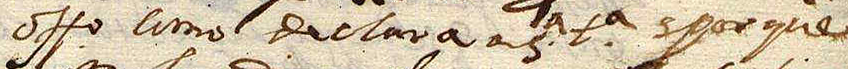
off.o como declara a 5.a t.a E porque
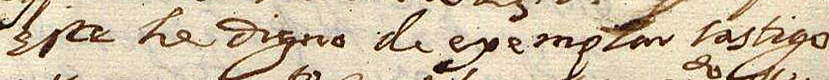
Este he digno de exemplar castigo
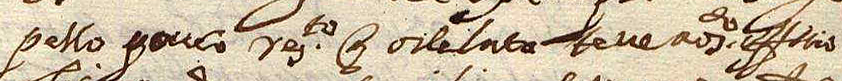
pello pouco res.to q̄ o delato teue ao s.to officio
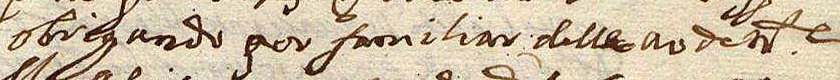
obrigando por familiar delle ao dent.e
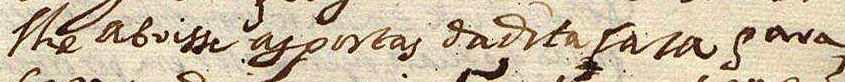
lhe abrisse as portas da dita Caza para
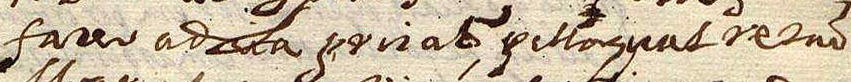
fazer a dita prizaõ, pella qual rezaõ
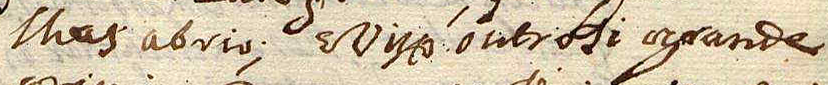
lhas abrio; E Visto outrosi o grande
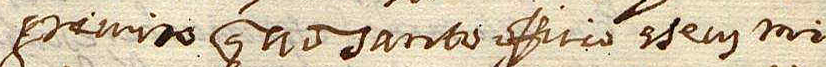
preiuizo q̄ ao santo officio E seus mi
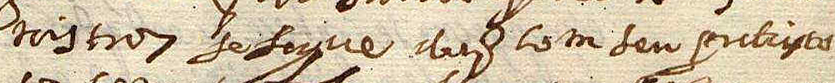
nistros se segue de q̄ com seu preteisto
